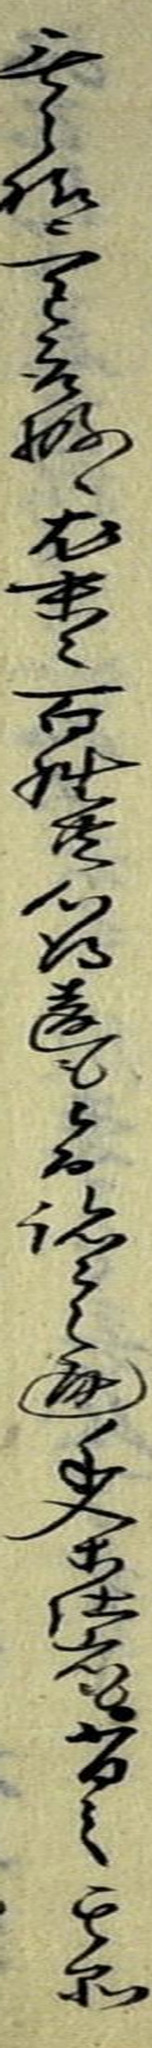無之様ニ可被取扱候尤末々百姓共心得違も候而跡々之通手入等仕者も有之其品
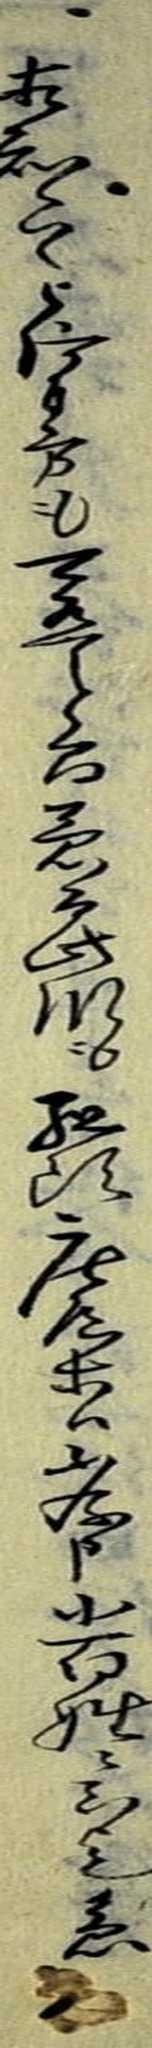相知候ハヽ被仰付方も可有之候間兼而此段も組頭庄屋等は不及申小百姓に至迄急
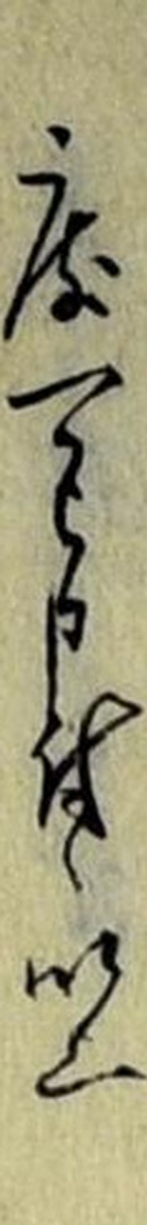度可被申付候以上
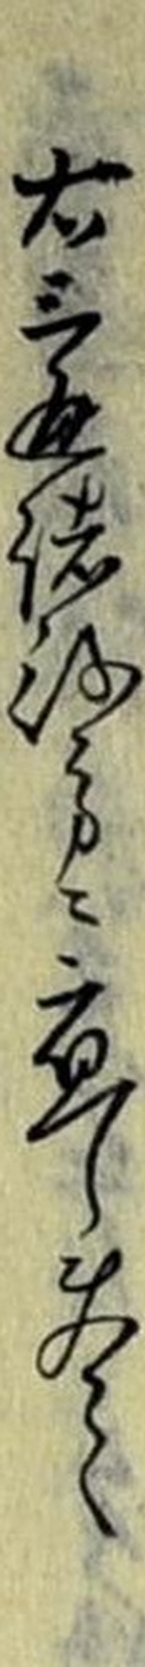右三通諸役方に応し夫々之
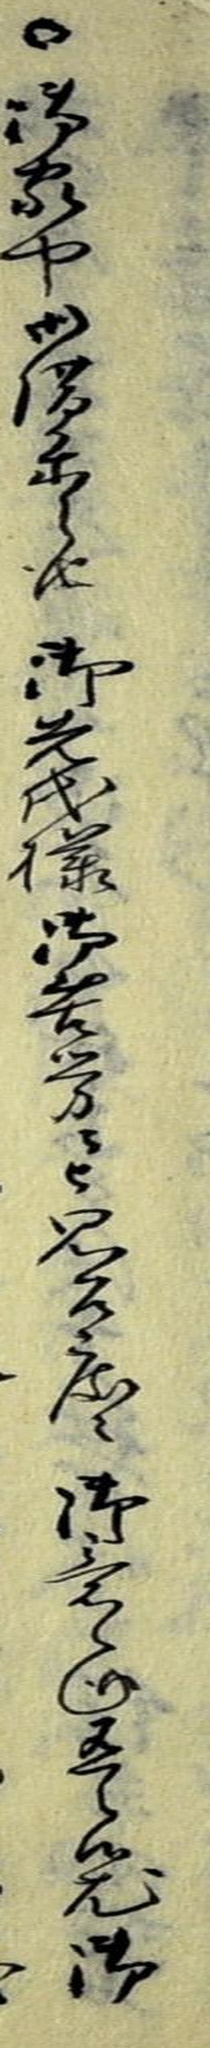〇御家中御借米之儀御先代様御苦労に被思召度々御意之趣有之候尤御
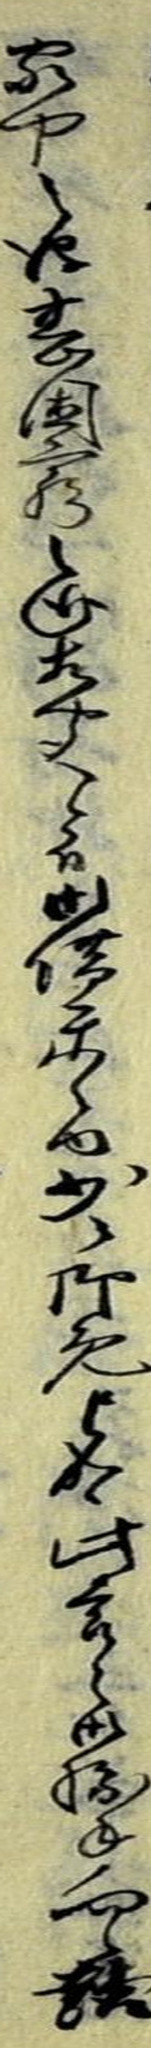家中之儀甚困窮之趣相聞候に付御借米之内少々御免被成候此節之御勝手向之趣
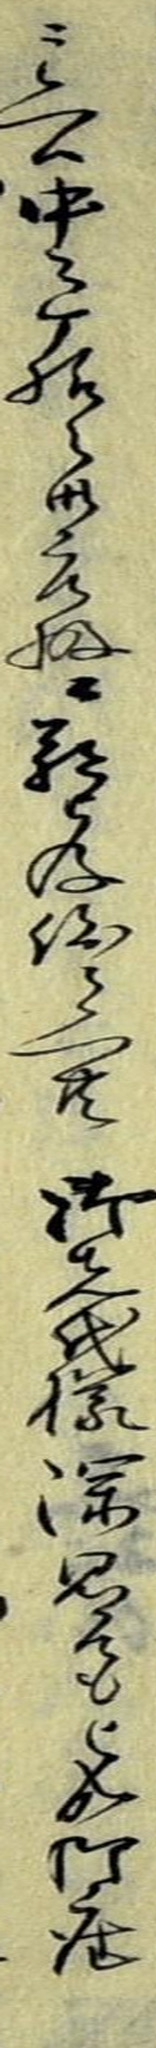に候へは中々ケ様之御取扱に難被及儀に候へ共御先代様深思召も被成御座
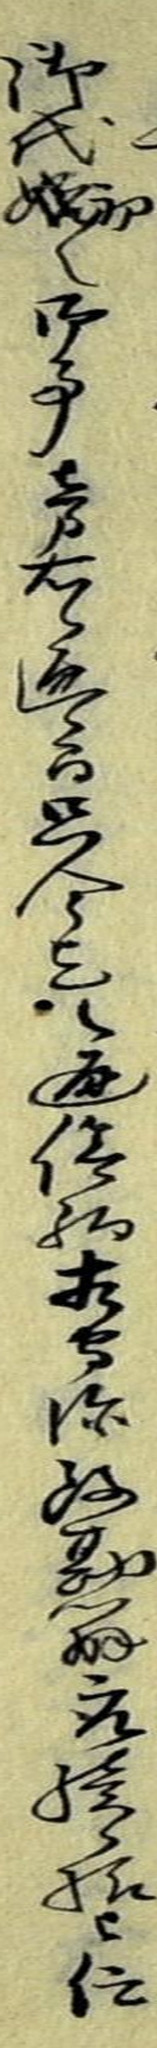御代始初之御事旁右之通候間只今迄之通倹約相守弥致勘弁取続候様被仰

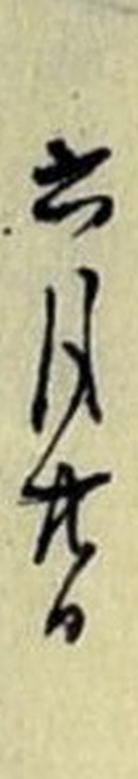六月廿日
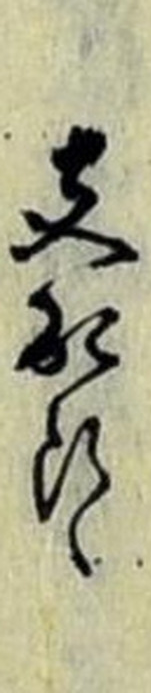支配頭へ
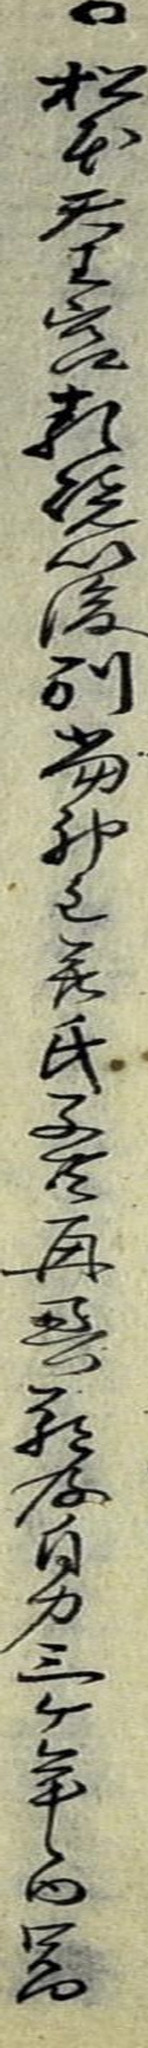〇松本天王宮類焼以後別当神主并氏子共再興難及自力三ヶ年之内冨
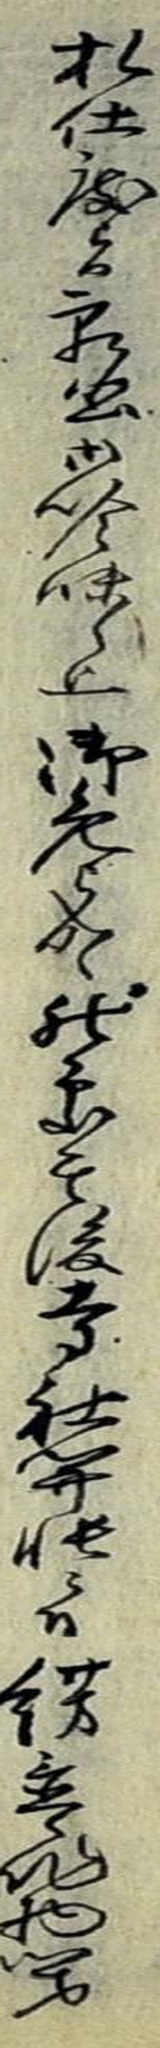札仕度旨願出御吟味之上御免被成候然処其後寺社開帳に付餝置候作物閉
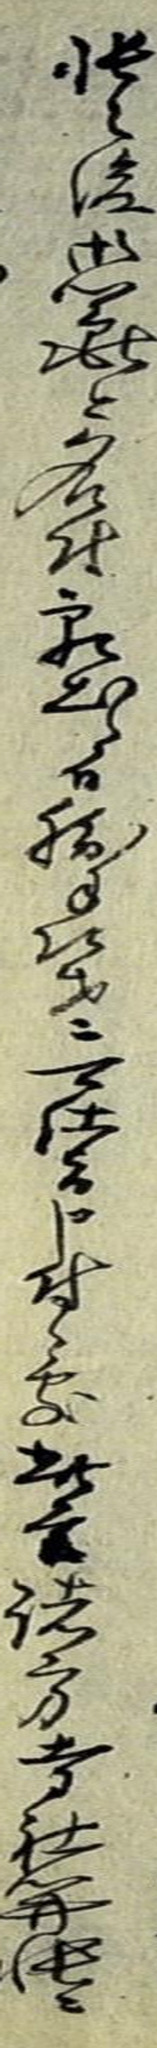帳之後御鬮と名付願出候に付勝手次第に可仕旨申付候処此節諸方寺社開帳に
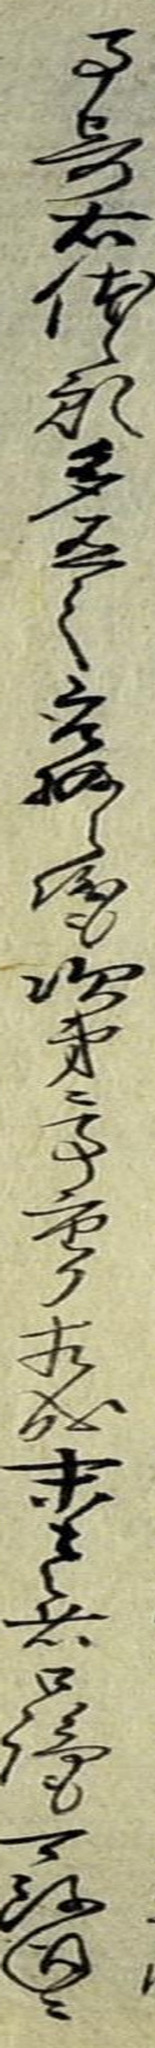事寄右躰之願多有之取扱候儀も次第に事重り相成末々之者口論も可致趣に
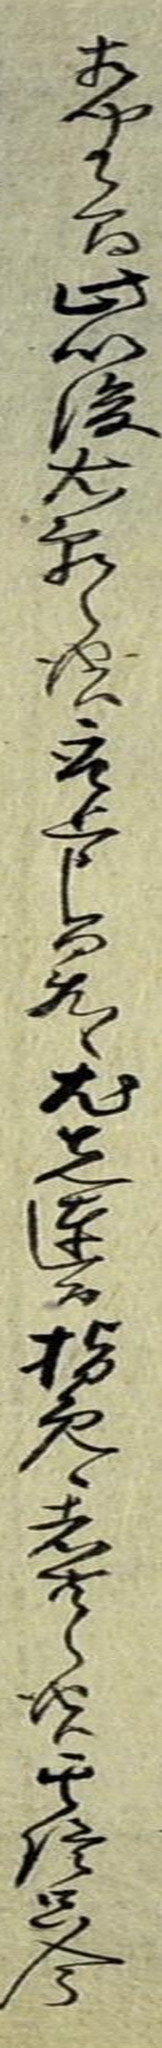相聞候間此以後右願之儀は取上申間敷候尤先達而指免候者共之儀は其侭只今
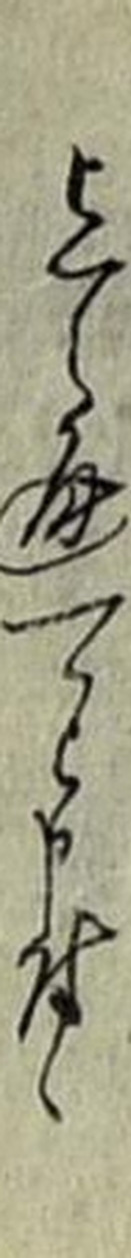迄之通可被申付候
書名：命令之部 二
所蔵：福井県文書館 Fukui Prefectural Archives
